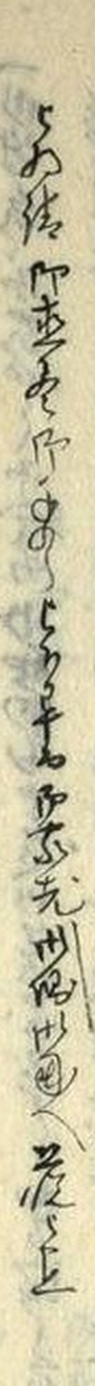被為請御直答御手のし被下畢而御家老御側御用人恐悦被申上
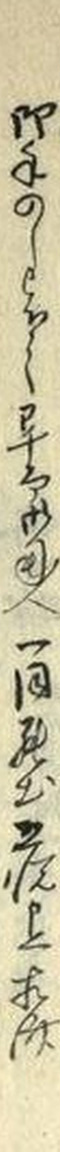御手のし被下之畢而御用人一同罷出恐悦申上相済
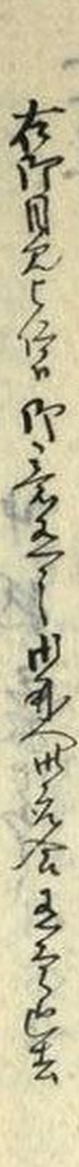右御目見被仰付御意有之御用人御取合有而退去
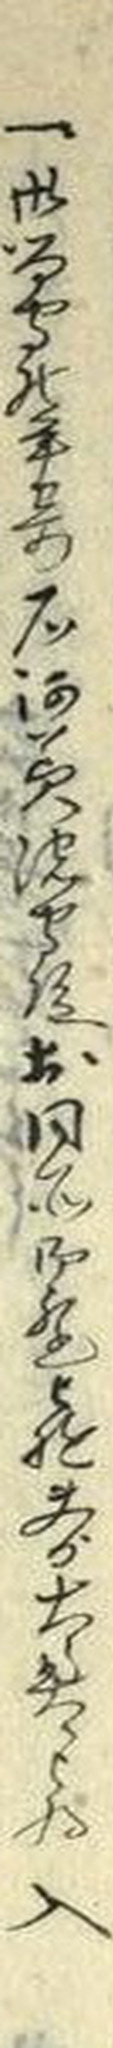一御留守居年寄石河美濃守殿於同所御逢被遊夫ゟ大奥へ被為入
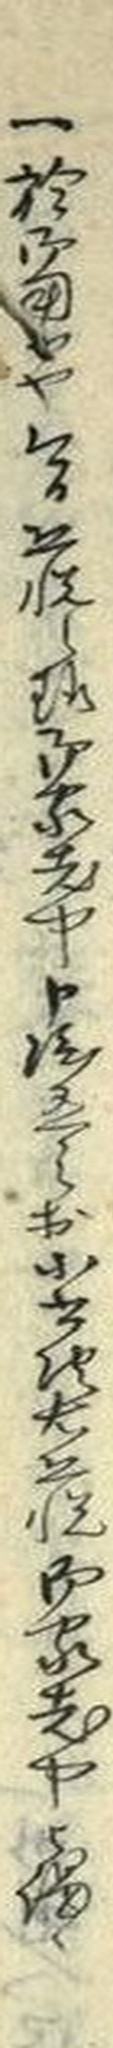一於御用部屋今日恐悦之趣御家老中申渡有之於小書院右恐悦御家老中被謁候

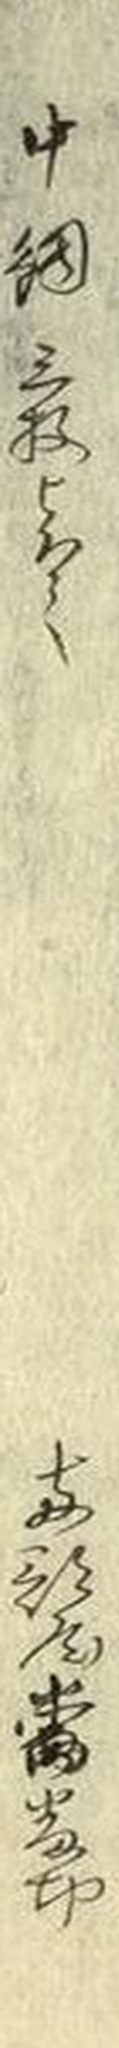中鯛三枚被下之両部屋当番切
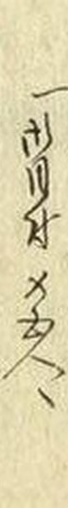御目付〆五人ヘ
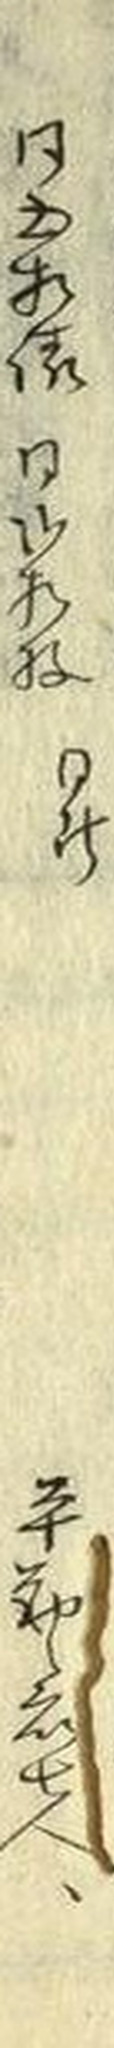同五拾俵同弐拾枚同断平勤之衆七人へ
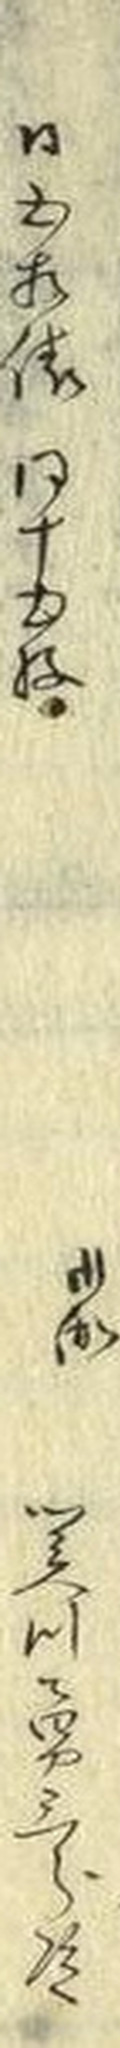同五拾俵同十五枚御伽関川勇三郎殿
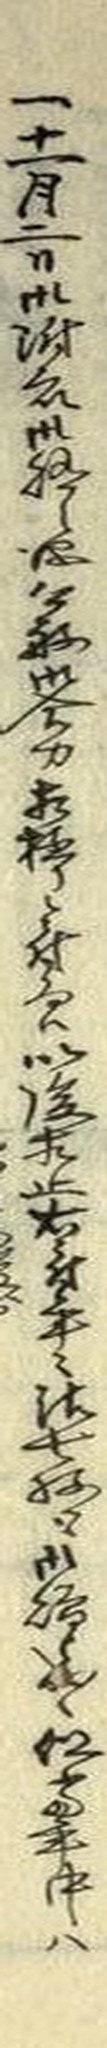一十一月二日御附衆御賄之儀今般御合力相極り候ニ付而ハ以後相止右ニ付年々銀七枚ツヽ御贈被成候但当年中ハ
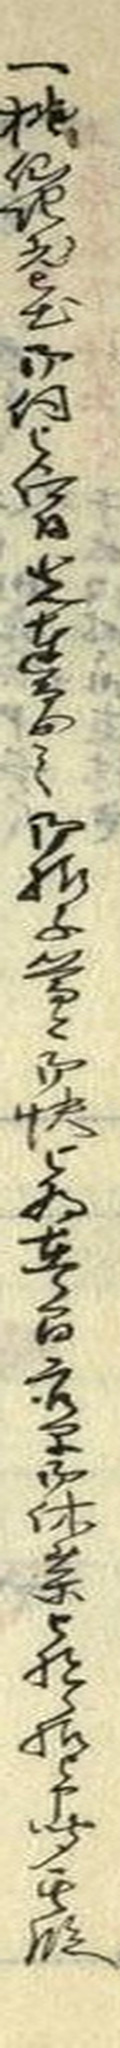一桃仙院老被出御伺被仰付先達而ゟ之御様子篤と御快被為在候間最早御休薬被遊候様被申聞其段
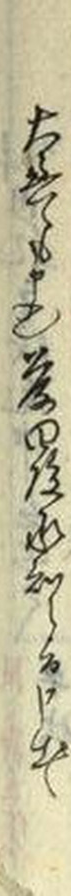大奥へも申込藤田殿承知之旨申出候
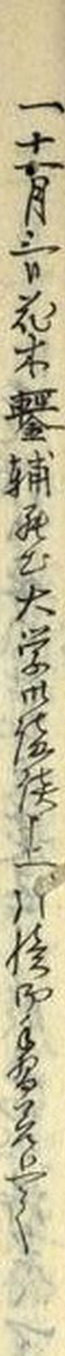一十一月三日花木鑋輔罷出大学御講談申上引続御手習差上之
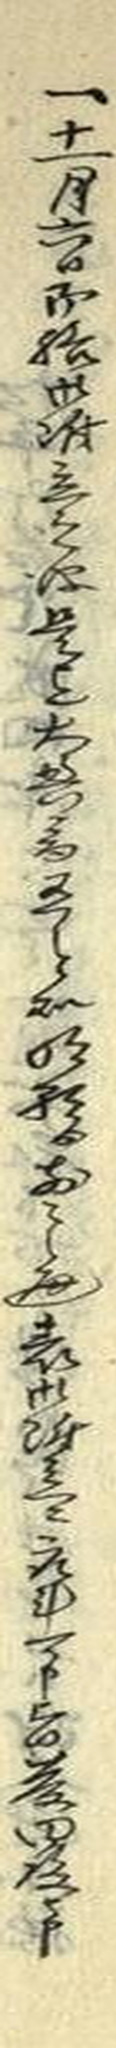一十一月六日御膳御附立之儀是迄大奥ニ而有之候処明朝ゟ前々之通表御附立ニ取計可申旨藤田殿被申
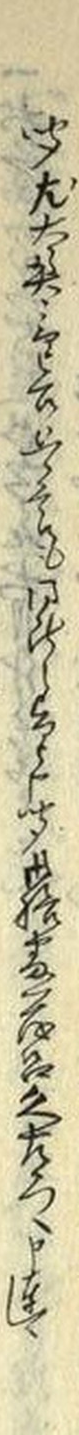聞尤大奥ニ而被召上候節も同断之旨被申聞御膳番茂呂久左衛門へ申達候
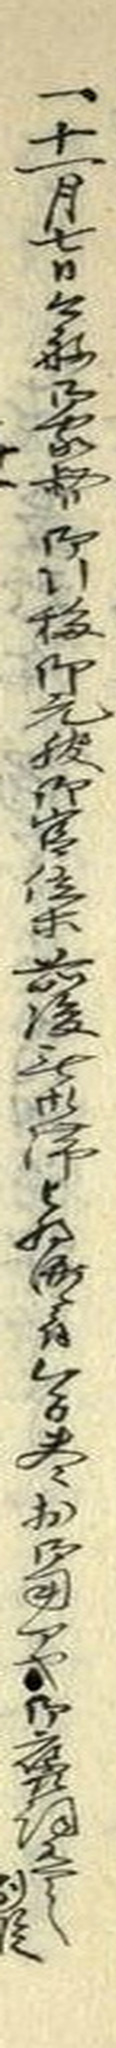一十一月七日今般御家督御引移御元服御官位等前後無御滞被為済候ニ付今日夫々於御用部屋御褒詞有之別段
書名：少傅日録抄（斉善付側向頭取日記、在府）
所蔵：福井県文書館 Fukui Prefectural Archives
